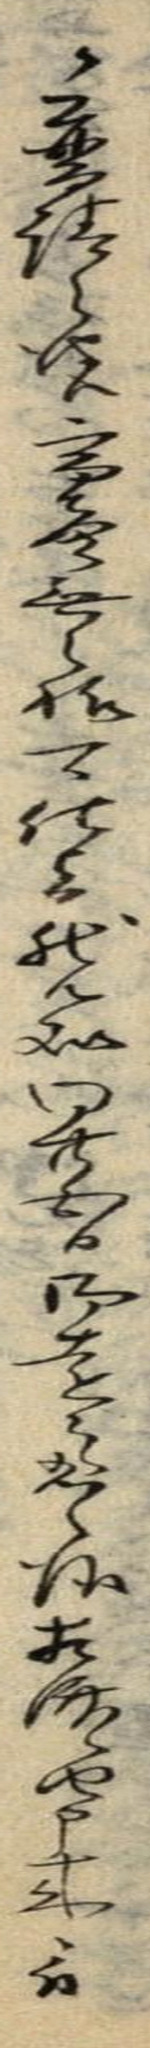候普請之儀は高声無之様可仕旨然ル処同廿五日御遠慮之趣相済候由申来候付
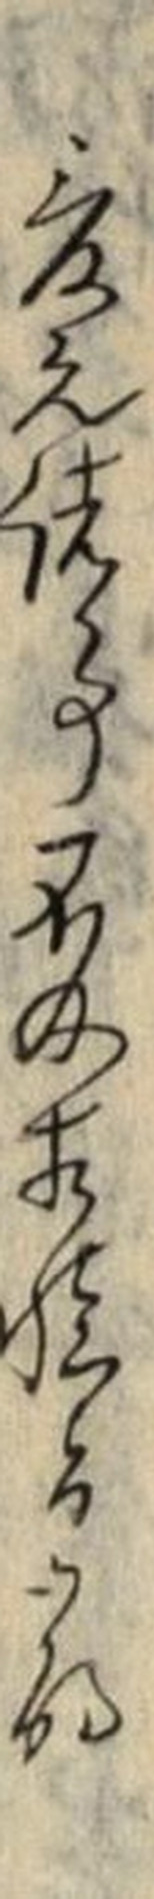爰元諸事不及相慎旨御触
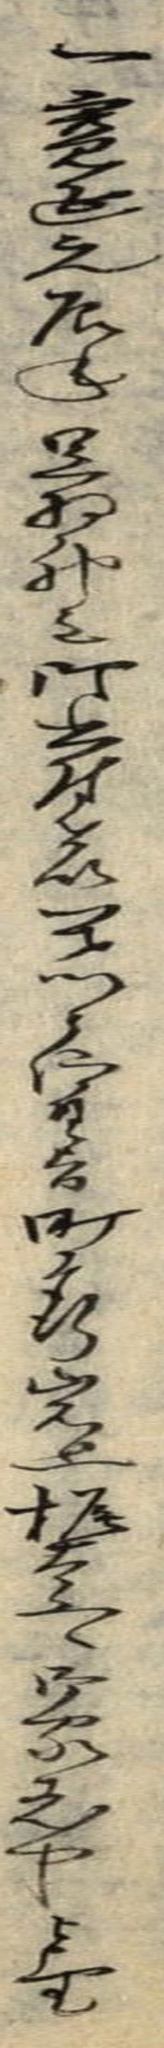一寛延元辰年足羽神主御書付を以閉門被仰付候旨町奉行岩上梶大夫へ御家老中被申聞候
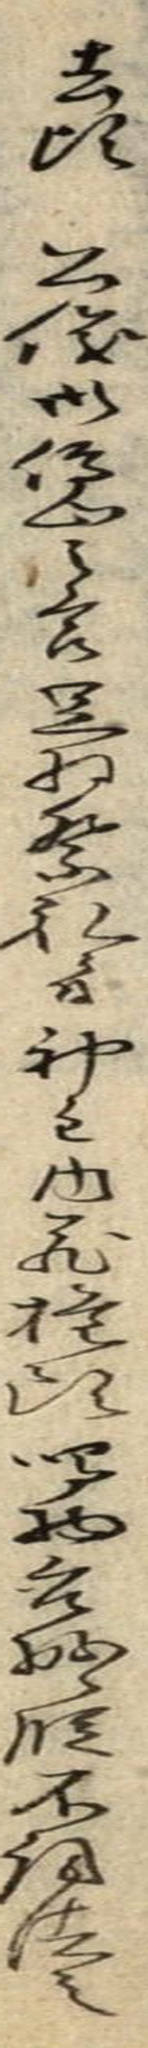去頃公儀御停止之節足羽祭礼に付神主内蔵権頭鳴物取扱候段不調法之
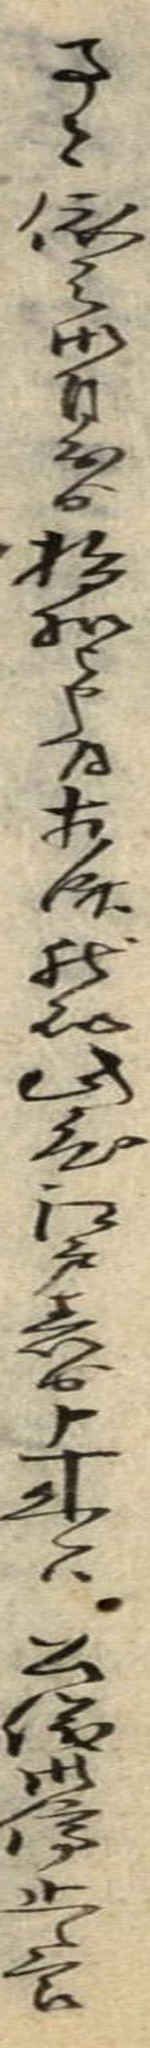事に候依之御自分ゟ指扣被申付相済然処此度江戸表ゟ申来候は公儀御停止之節
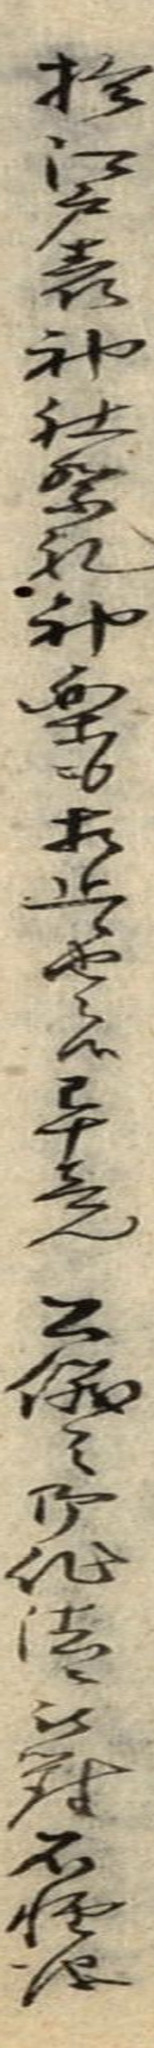於江戸表神社祭礼神楽も相止候由に候畢竟公儀之御作法に被対不軽儀
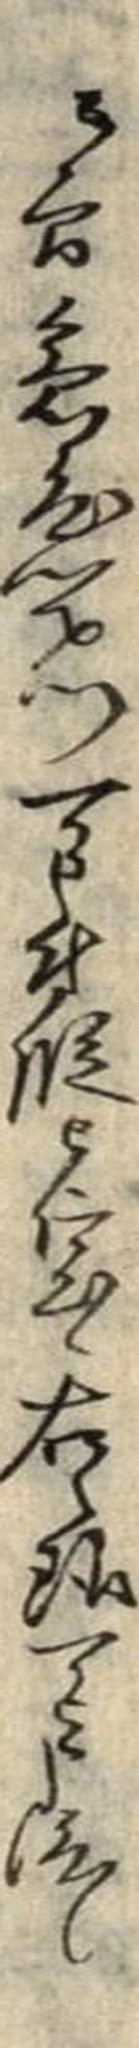に候間急度閉門可申付段被仰出候右之趣可被申渡候
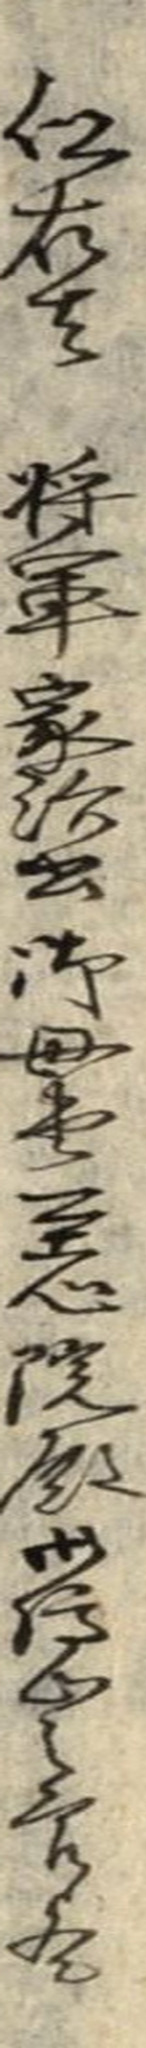但右は将軍家治公御母堂至心院殿御停止之節歟
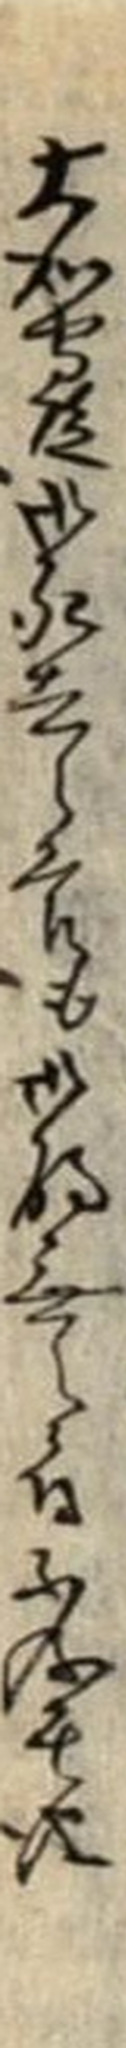大和守殿御死去之節も御触無之に付不及其儀
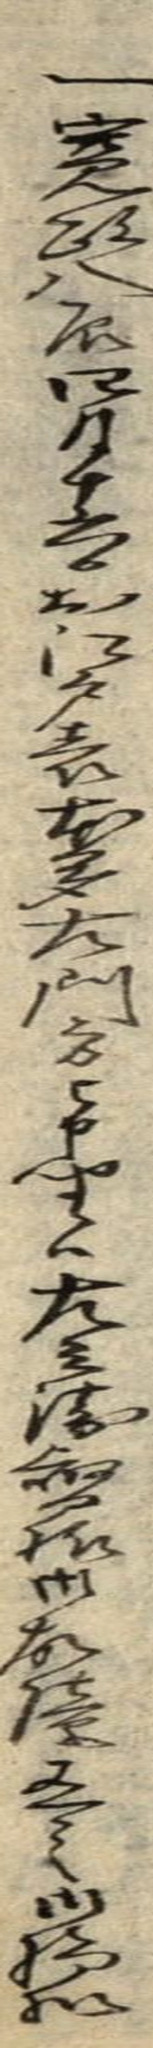一寛政八辰四月十六日於江戸表本多左門方被申聞候は左兵衛督様御故障有之御指扣
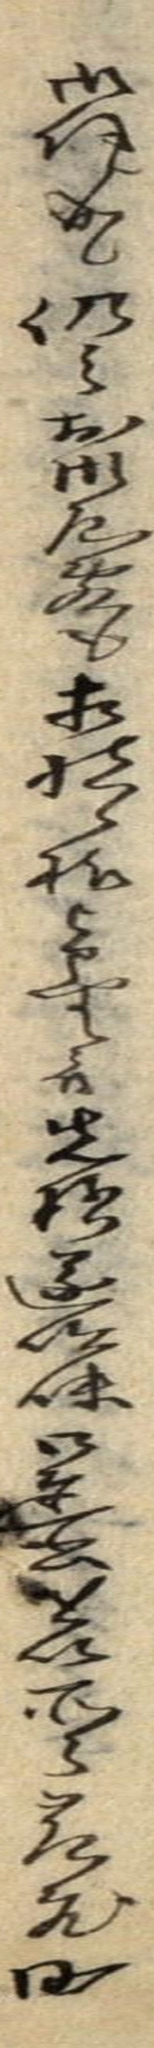御伺被成候仍之於御屋敷も相慎候様被申聞候に付先格遂吟味口達書を以所々御屋敷町
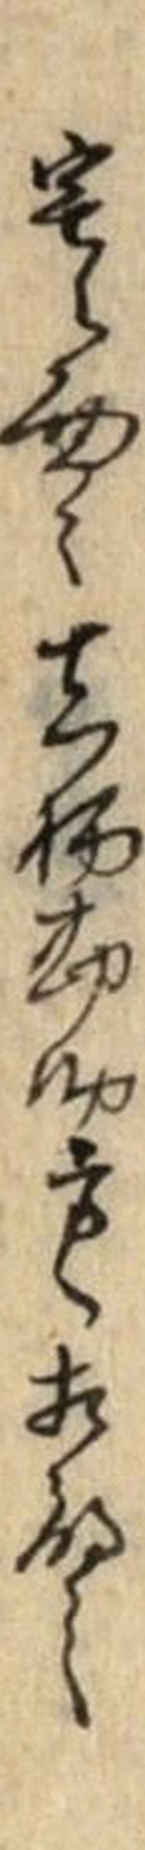宅之面々真柄勘助方へ相触之

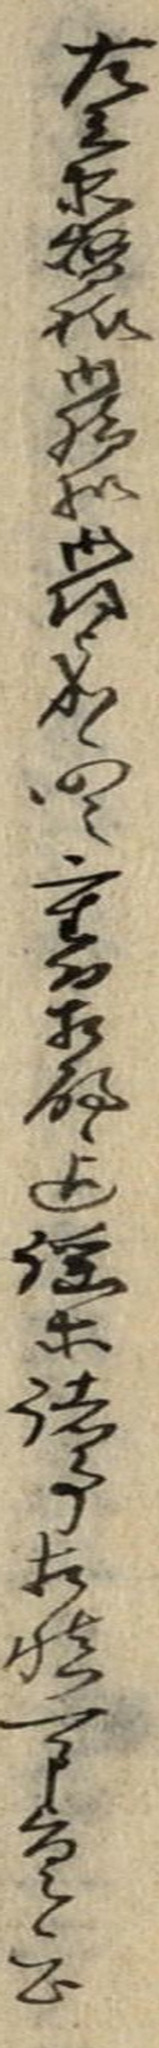左兵衛督様御指扣御伺被成候仍之重て相触候迄謡等諸事相慎可申旨に候以上
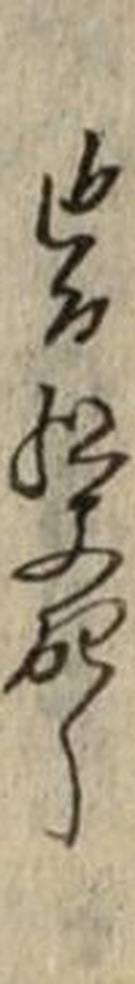追て組支配へ
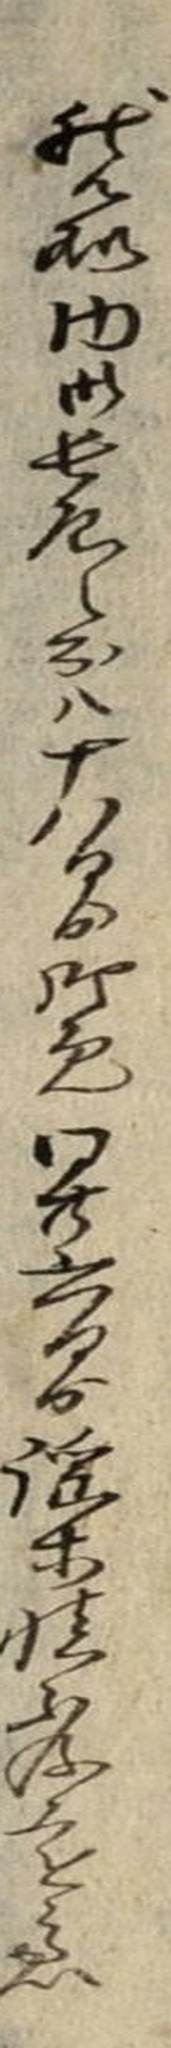然ル処内御長屋之分は十八日ゟ御免同廿六日ゟ謡等慎不及遠慮
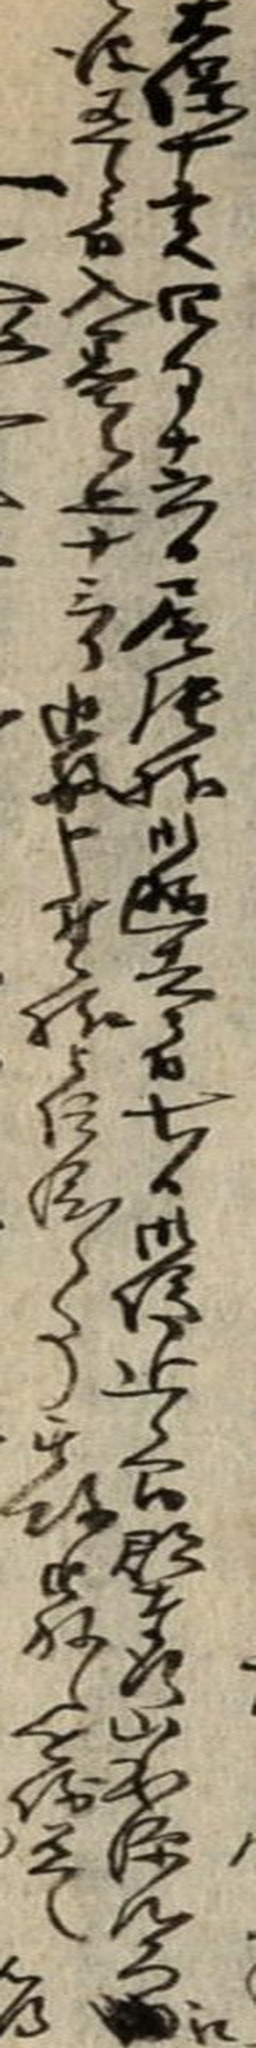之儀有之候に付入墨之上十三り追放申付候様被仰渡候事其余追放之近例有之
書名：御停止異変死失
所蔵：福井県文書館 Fukui Prefectural Archives
